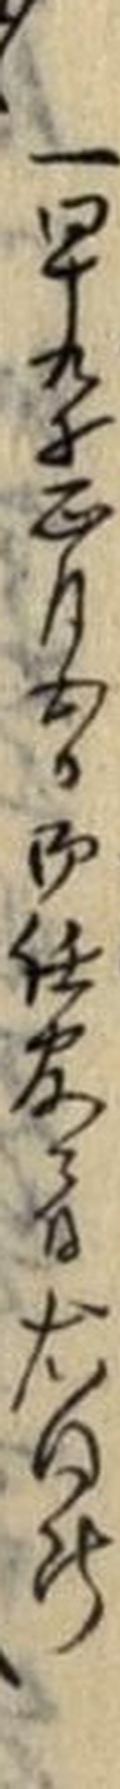一同十九寅正月五日御任官に付右同断
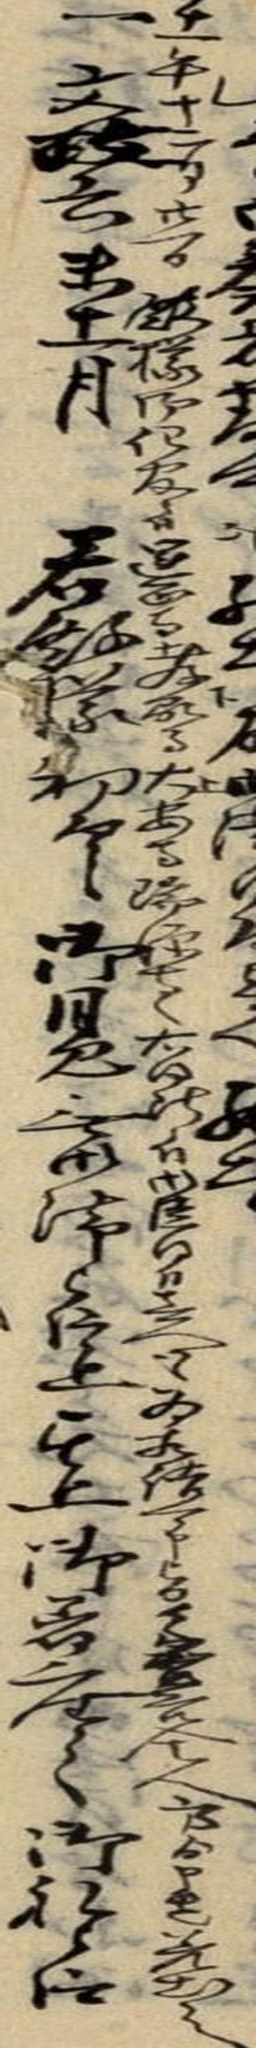一文政六未十一月若殿様初而之御目見無御滞被仰上御着座之御礼被仰
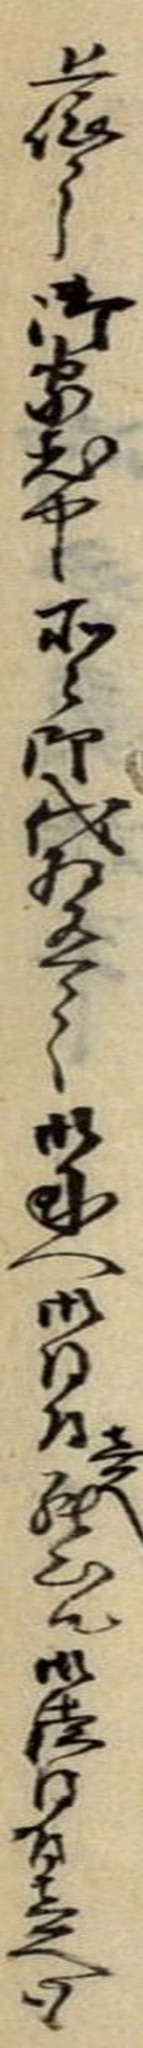上依之御家老中所々御代拝有之御用人御目付壱人罷出候御徒目付壱人つゝ
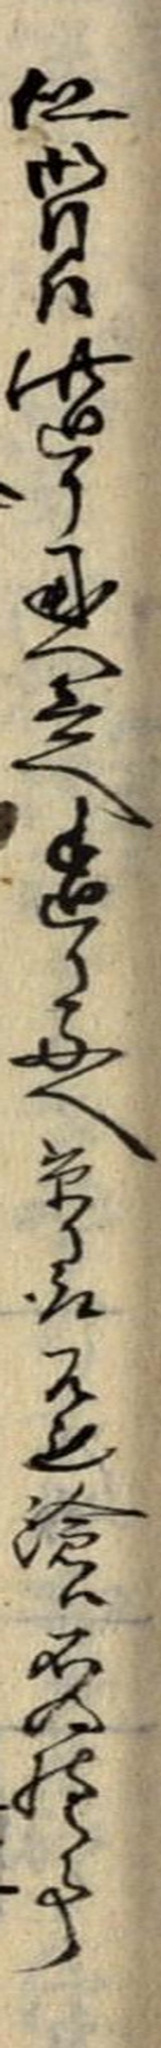但御目付供廻り用人壱人手廻り両人草り取召連鎗は不為持候事

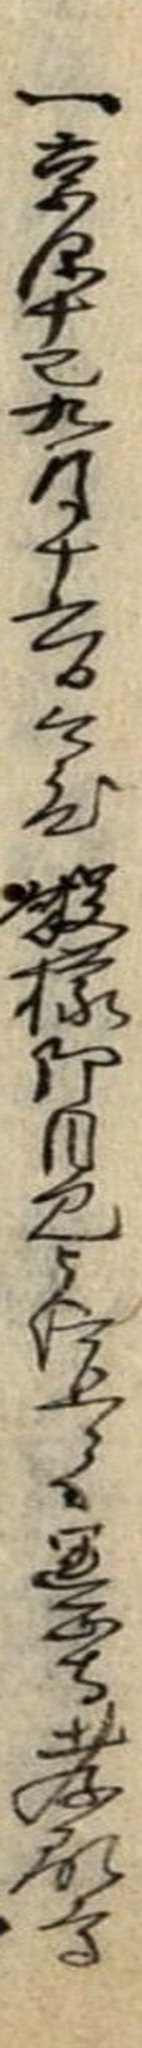一享保十巳九月十六日今度殿様御目見被仰上候に付運正寺孝顕寺
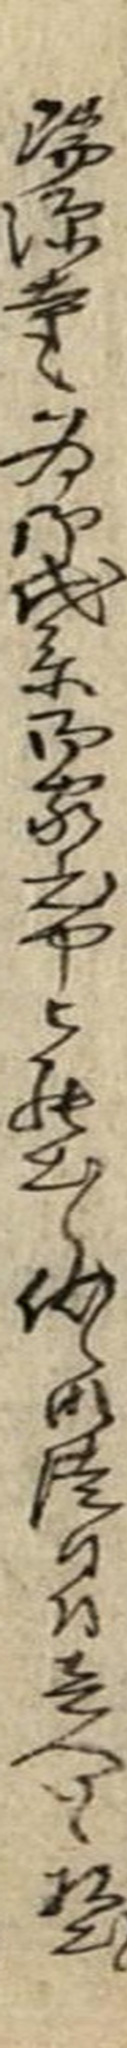瑞源寺へ為御代参御家老中被罷出候依之御徒目付壱人ツゝ指出候
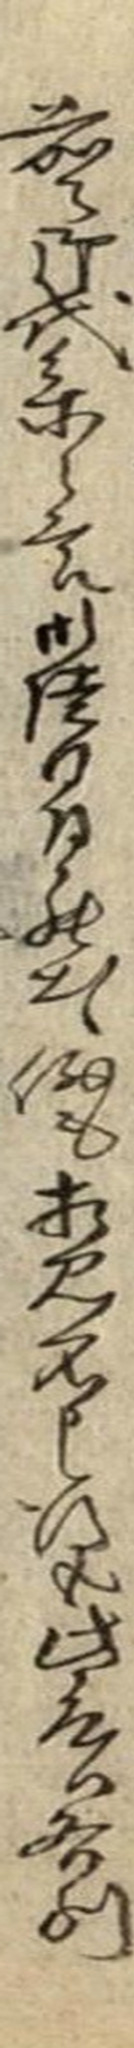前々御代参之節御徒目付罷出候例も相見不申候得共此度は各別
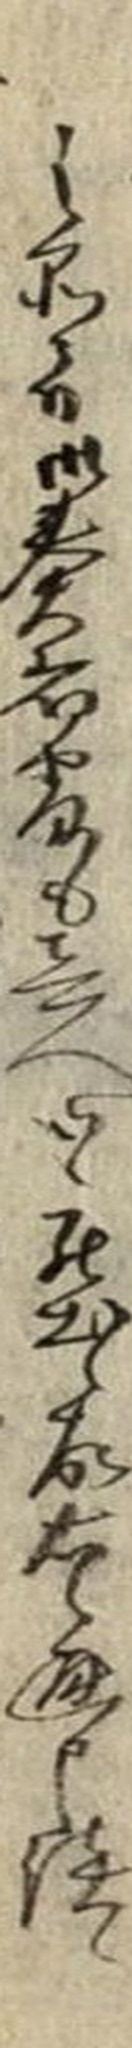之品に付御奏者番も壱人ツゝ罷出候故右之通申談候
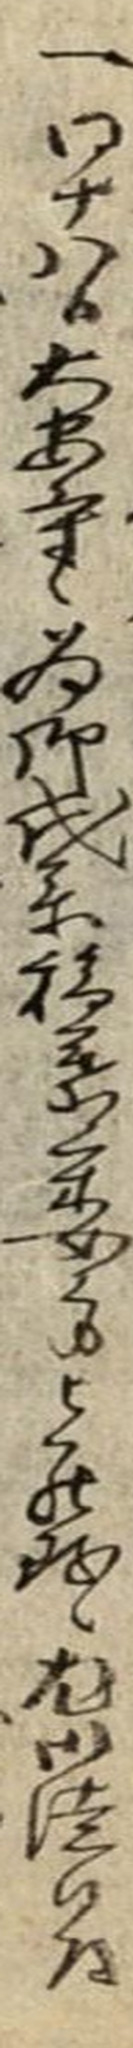一同十八日大安寺へ為御代参稲葉采女方被罷越候尤御徒目付
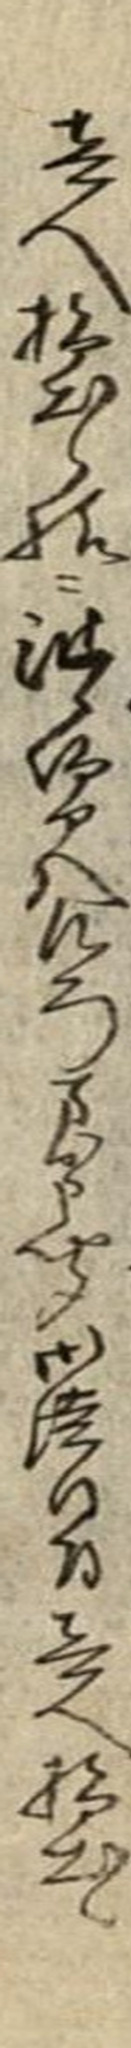壱人指出候様波々伯部八左衛門方被申聞御徒目付壱人指出候
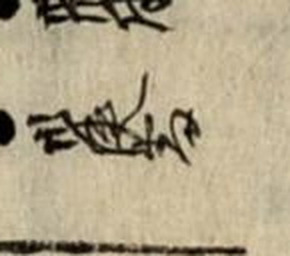●御使番
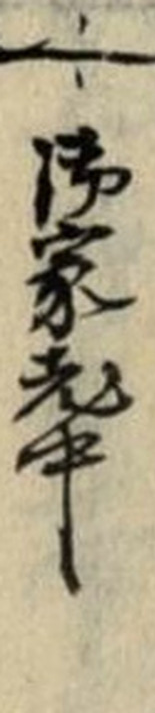御家老中
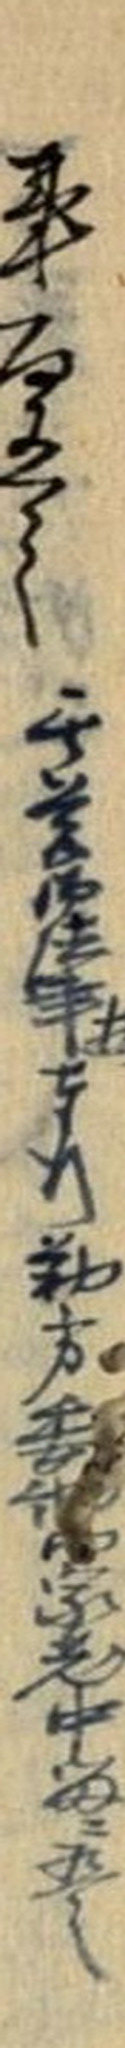事留有之其節御法事中惣奉行勤方委細御家老中留に有之
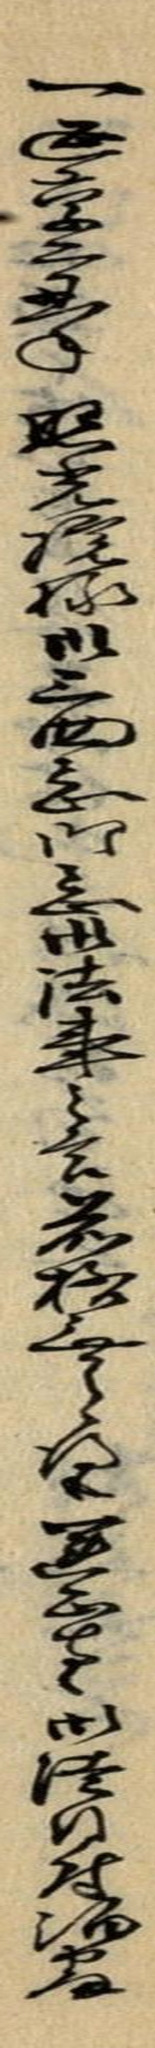一延享二丑年照光院様御三回忌御忌御法事之節前格無之候得共運正寺へ御徒目付泊番
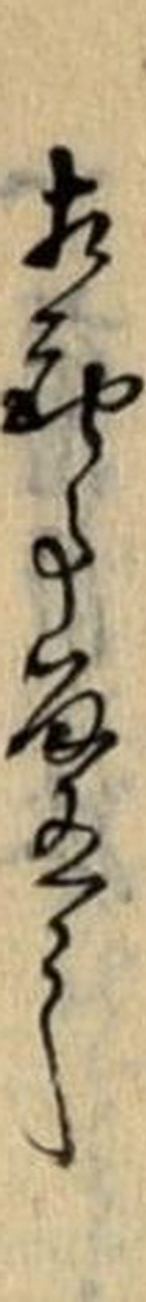相勤候事留有之
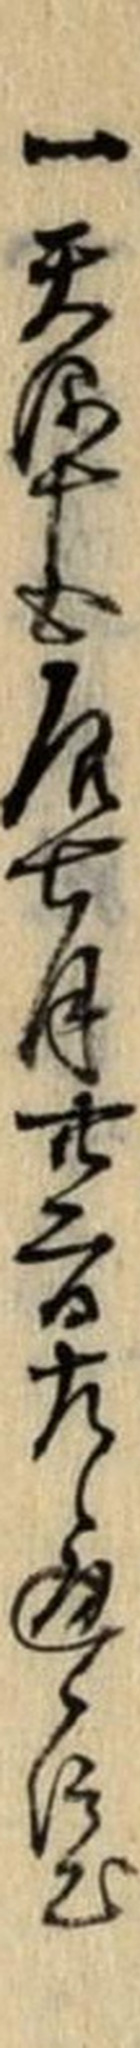一天保十五辰七月廿二日左之通被仰出
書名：蒐輯之部
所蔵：福井県文書館 Fukui Prefectural Archives
